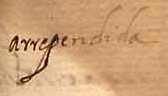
arrependida
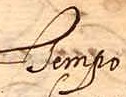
Tempo
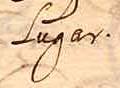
Lugar.
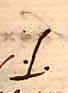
.L.
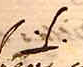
.L.
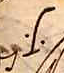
.L.
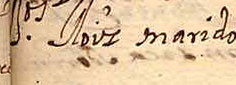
D.os Roiz̄ marido
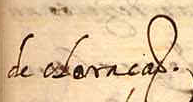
declaraçaõ.
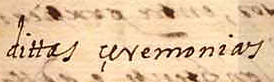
dittas çeremonias
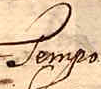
Tempo
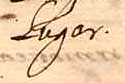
Lugar.
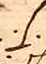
.L.
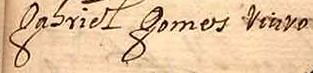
Gabriel Gomes viuvo
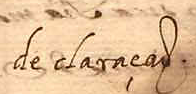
declaraçaõ.
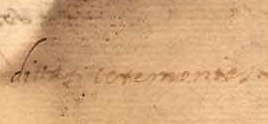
dittas ceremonias
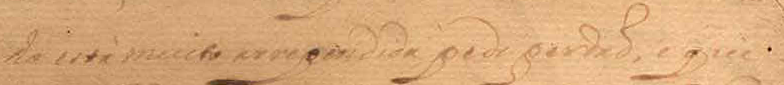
do està muito arrependida pede perdaõ e que
